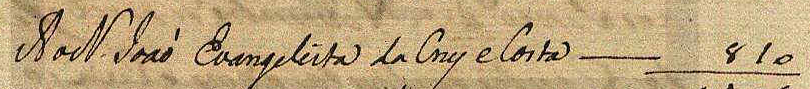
Ao N. Ioaõ Evangelista da Crus e Costa 810
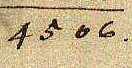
1506.
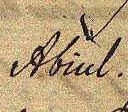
Abiul.
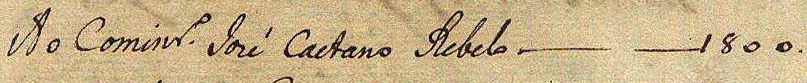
Ao Comissr.o Iozé Caetano Rebelo 1800.
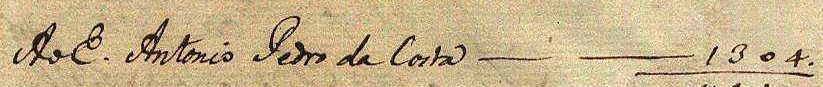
Ao E. Antonio Pedro da Costa 1304.
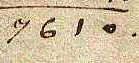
7610.
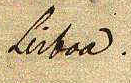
Lisboa.
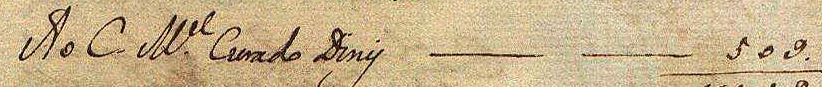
Ao C. M.el Curado Dinis 509.
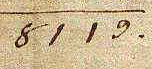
8119.
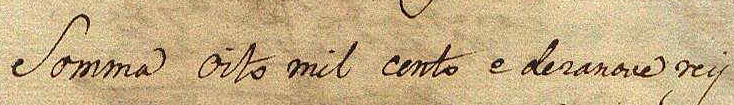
Somma oito mil cento e dezanoue reis
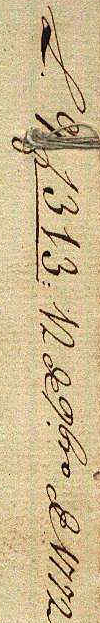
L.o f 1313: 12 de 9.bro d̄ 1772
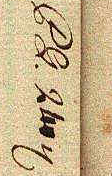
PG. 240 rs
